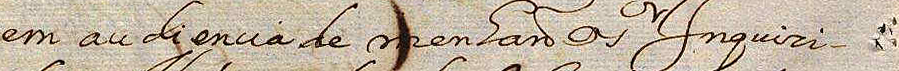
em audiençia de menhan̄ o s.or Jnquizi
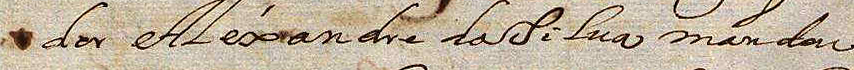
dor Alexandre da Silua mandou
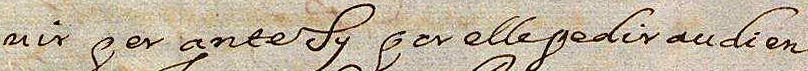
uir perante Sy por elle pedir audien
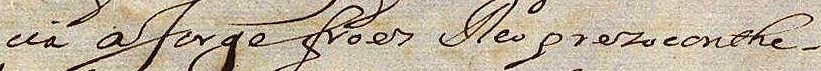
çia a Jorge froes Reo prezo conthe
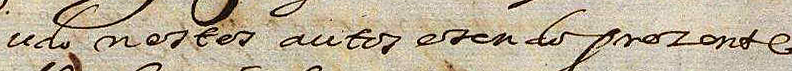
udo nestes autos e sendo prezente
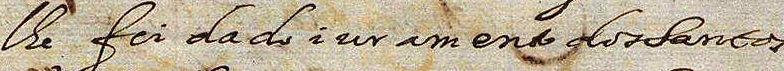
lhe foi dado iuramento dos santos
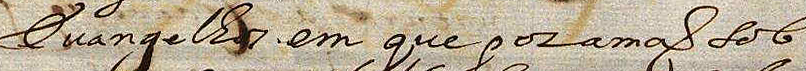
Euangelhos em que poz a maõ sob
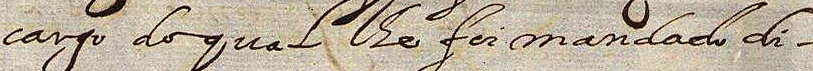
cargo do qual lhe foi mandado di
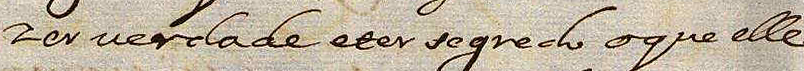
zer uerdade e ter segredo o que elle
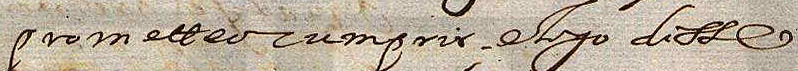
prometteo cumprir, e logo disse
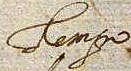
Tempo
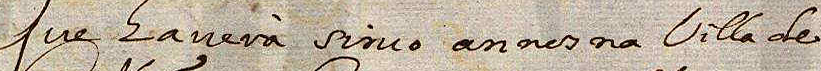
Que hauerà sinco annos na Villa de
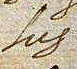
Lug.
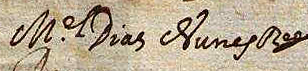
M.el Dias Nunes Reo
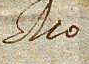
Reo.
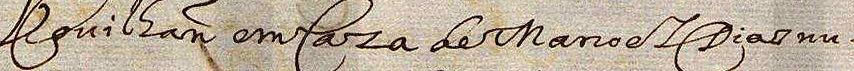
Couilhan̄ em Caza de Manoel Dias nu
